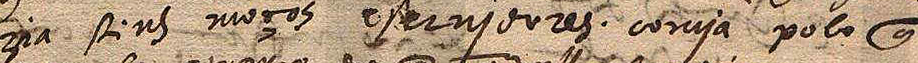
zia seus moços e serujdores. comja polo q̄
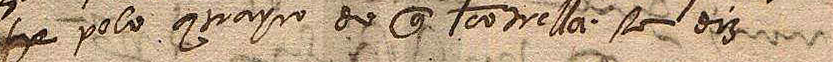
he polo ꝯtrayro do q̄ c̄otr ella se diz
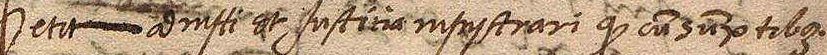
Petit admjti Et Justicia mjnjstrari ꝙ cū cūptibꝯ.
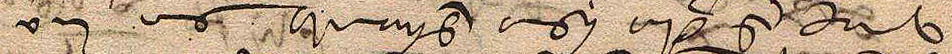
Com os quays asy ap̄sētado
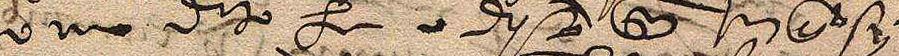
como dito he o dyto s̄or Jmq̄sy
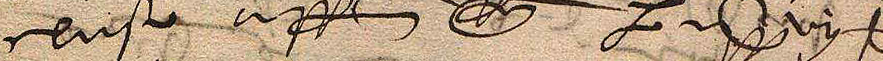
cluso affm̄ R̄oz ho esp̄vy
